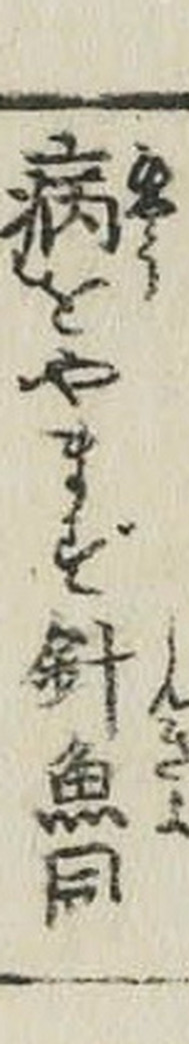病をやまず針魚同
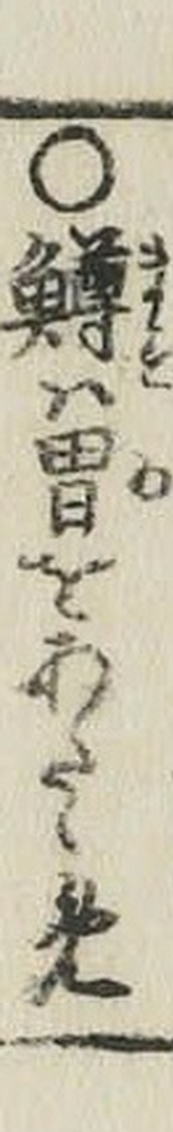○鱒は胃をあたゝめ
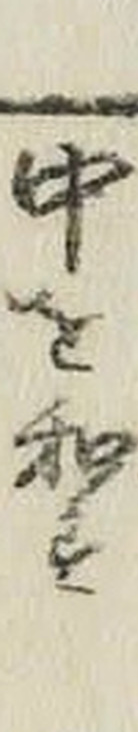中を和す
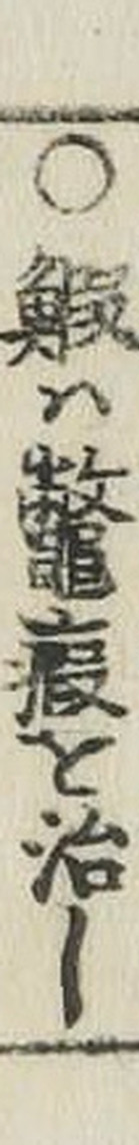○鰕は鼈瘕を治し
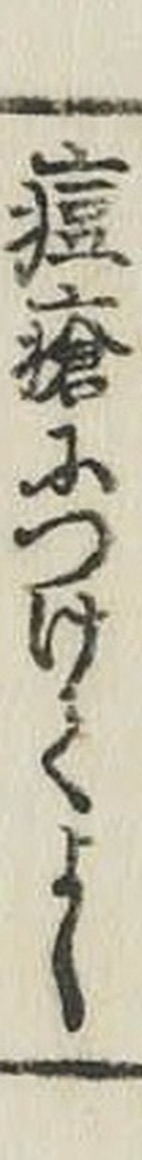痘瘡につけてよし
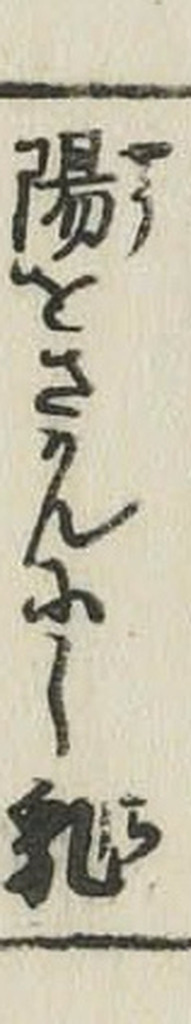陽をさかんにし乳
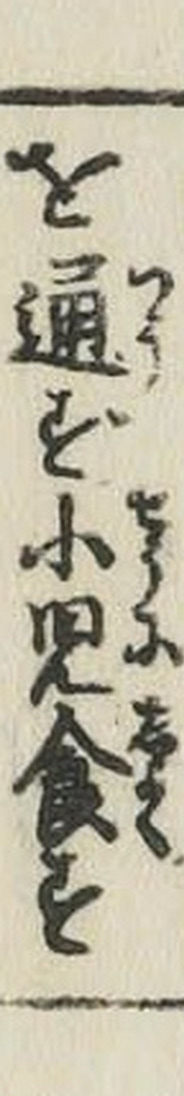を通ず小児食す
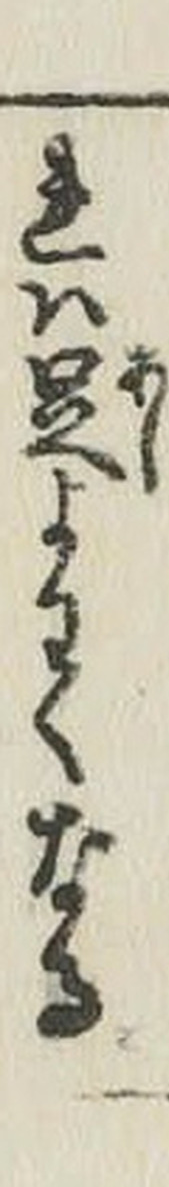れは足よわくなる
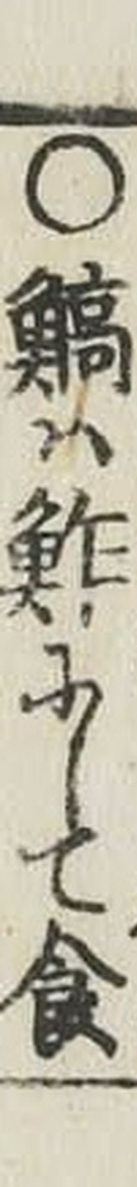○鰝は鮓にして食
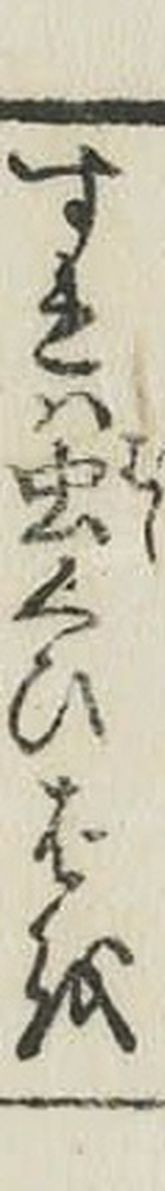すれは虫くひばを
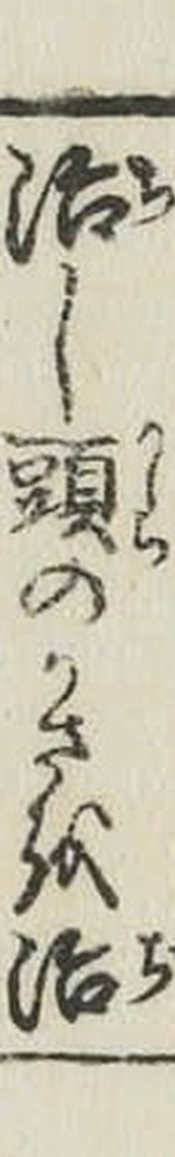治し頭のかさを治
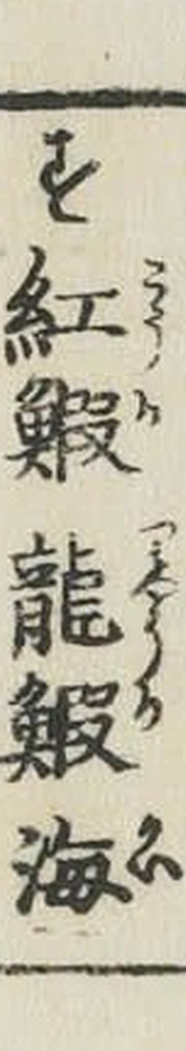す紅鰕龍鰕海
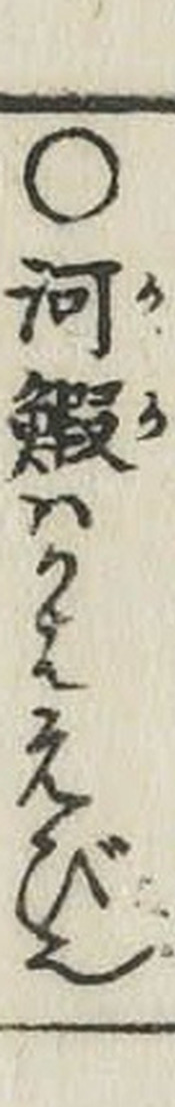○河鰕はかはえび也
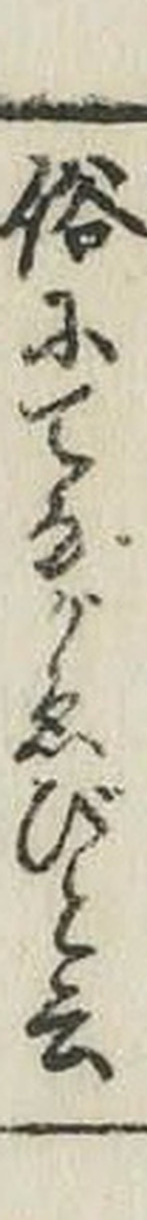俗にてながゑびと云
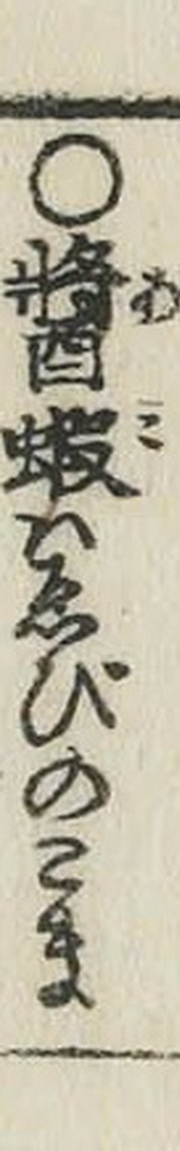○醤蝦はゑびのこま
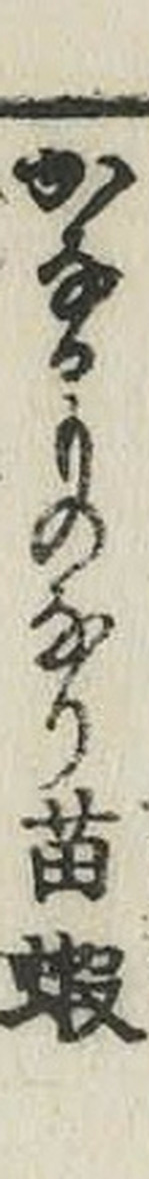かなるものなり苗蝦
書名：増補頭書訓蒙図彙大成 10巻 7:巻之14-16
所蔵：東京学芸大学教育コンテンツアーカイブ
